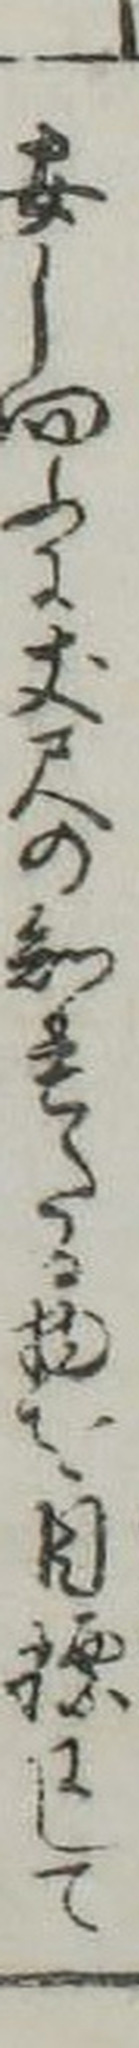安し向ふに丈尺の知れたる物を目標にして
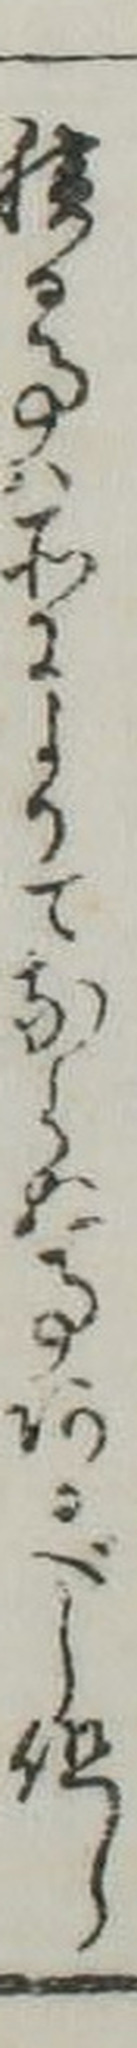積る事は所によりてならぬ事あるべし但し
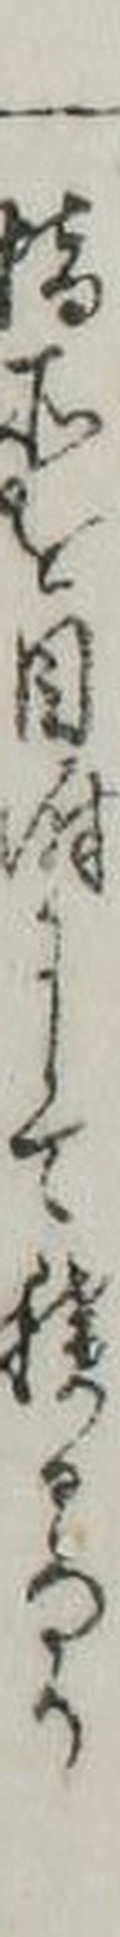橋所を目附にして積るなり
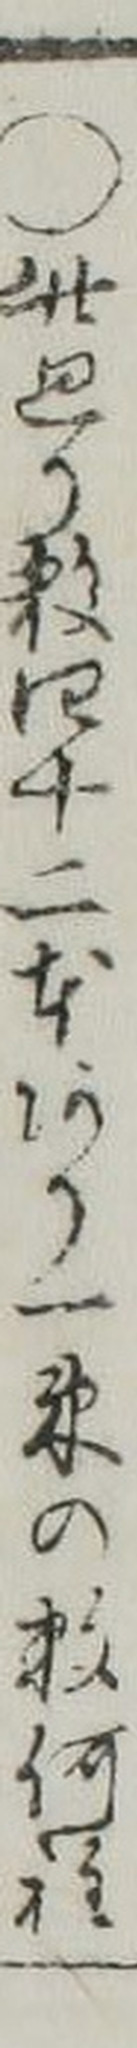○此廻りの数四十二本あり一束の数何程
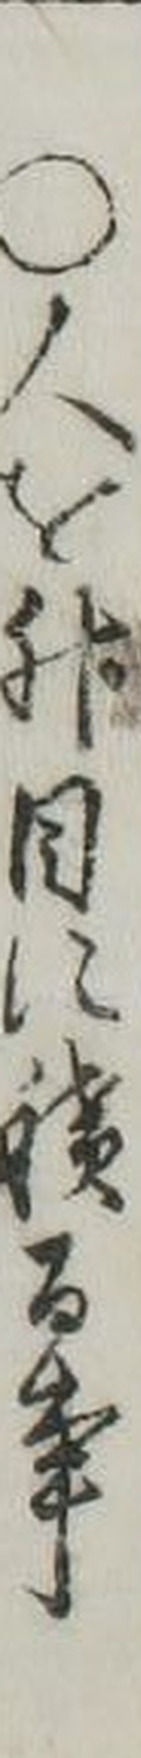○人を升目に積る事
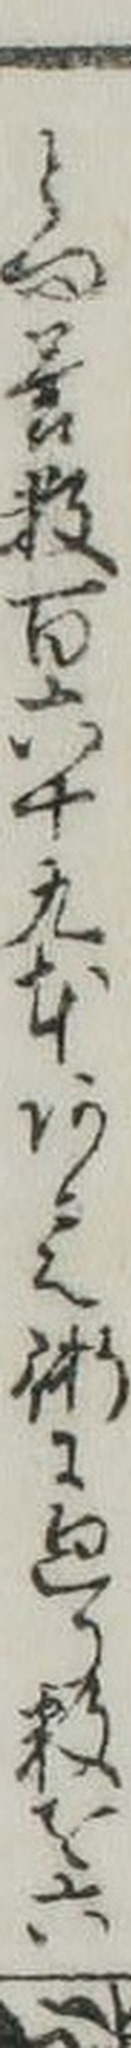と問答数百六十九本ある也術に廻り数を六
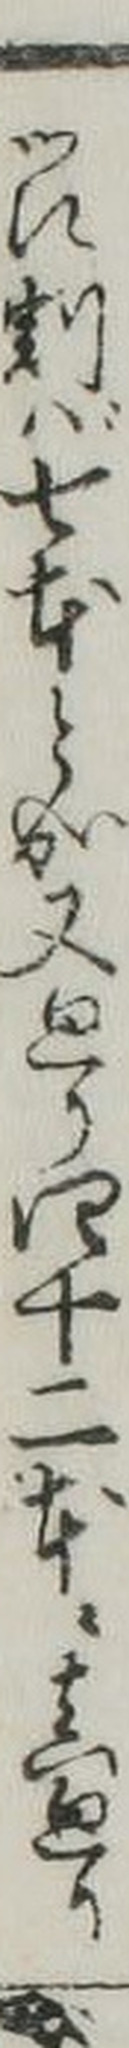ツに割ば七本と成又廻り四十二本に真廻り
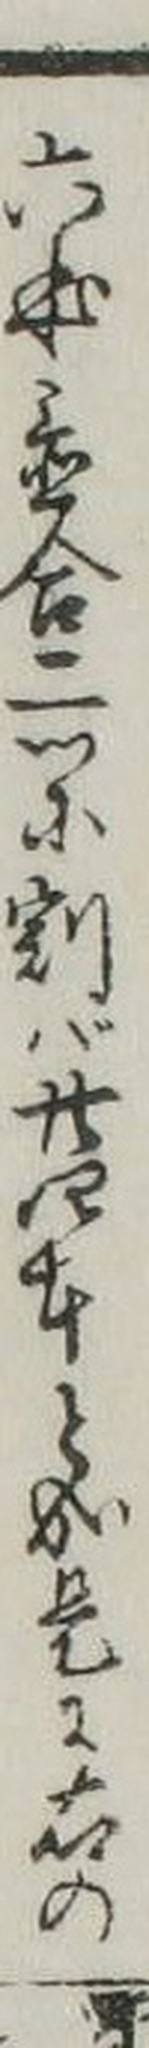六本置合二ツに割ば廿四本と成是に右の
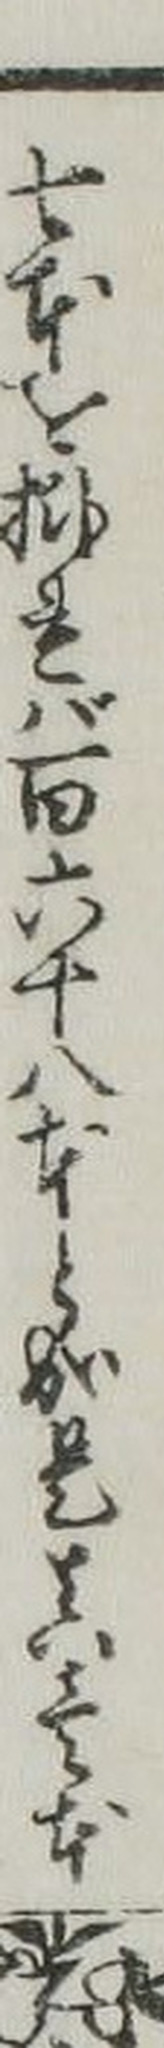七本を掛れば百六十八本と成是真壱本
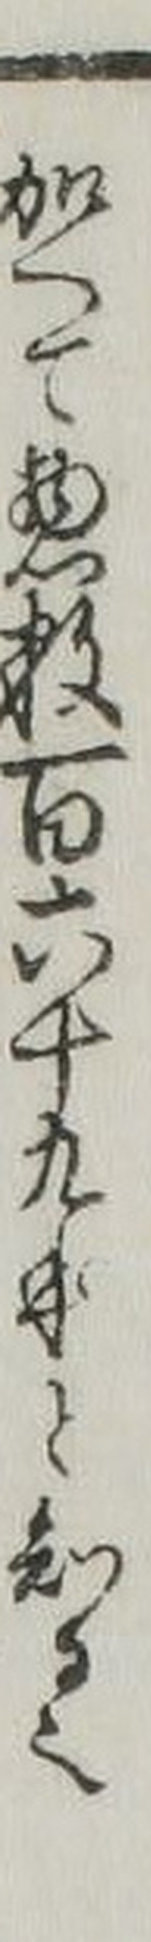加へて惣数百六十九本と知る也
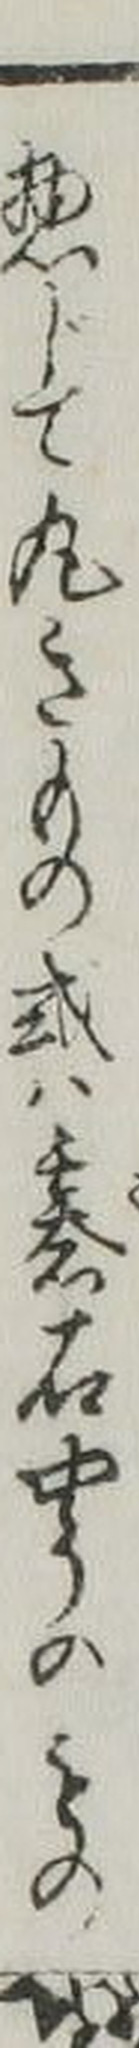惣じて丸きもの或は碁石やうのもの
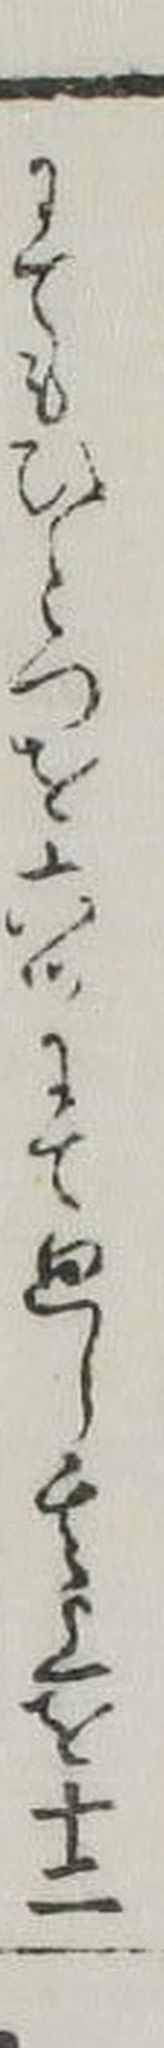にてもひとつを六ツにて廻し其上を十二
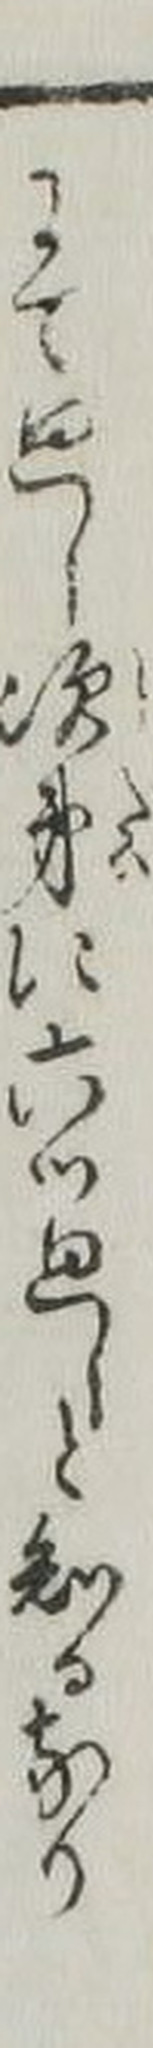にて廻し次第に六ツ廻しと知るなり
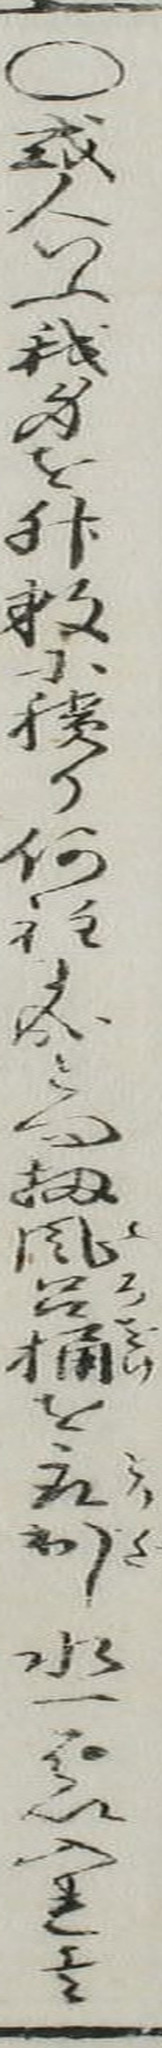○或人いふ我身を升数に積り何程に成と問扠風呂桶を取出し水一ぱい入れ壱
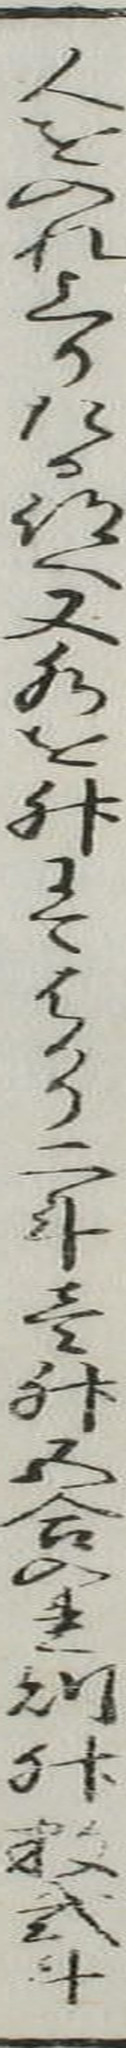人を入れ上りたる跡へ又水を升にてはかり二斗壱升五合入れ則升数弐斗
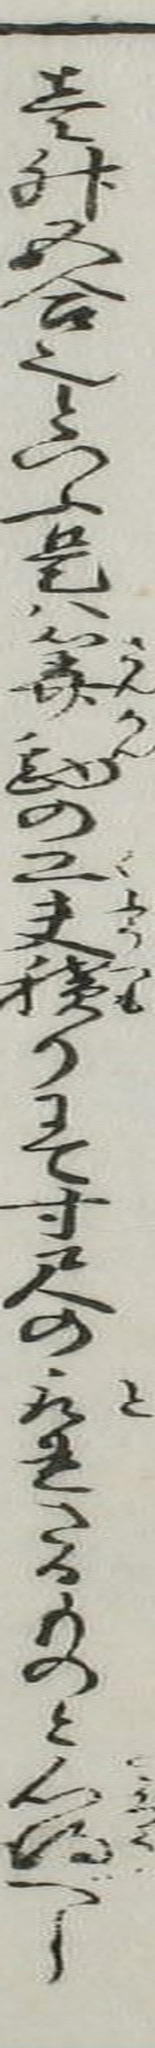壱升五合也といふ是は算勘の工夫積りにて寸尺の取れさるものと心得べし
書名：宝玉塵劫記
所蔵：東京学芸大学教育コンテンツアーカイブ
